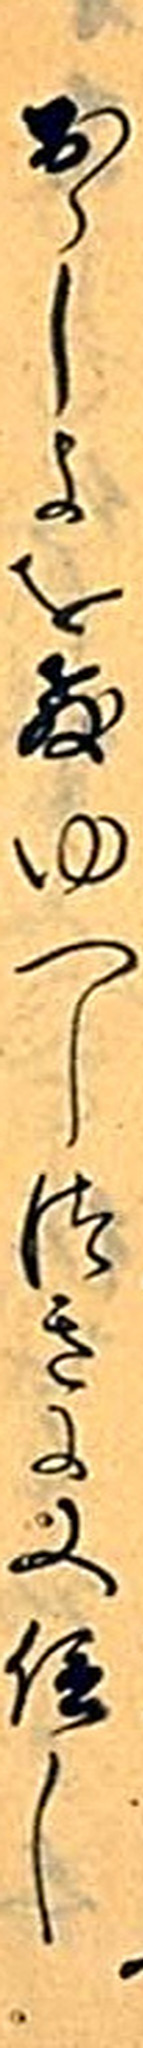おらしよを教ゆへしつきに又信し
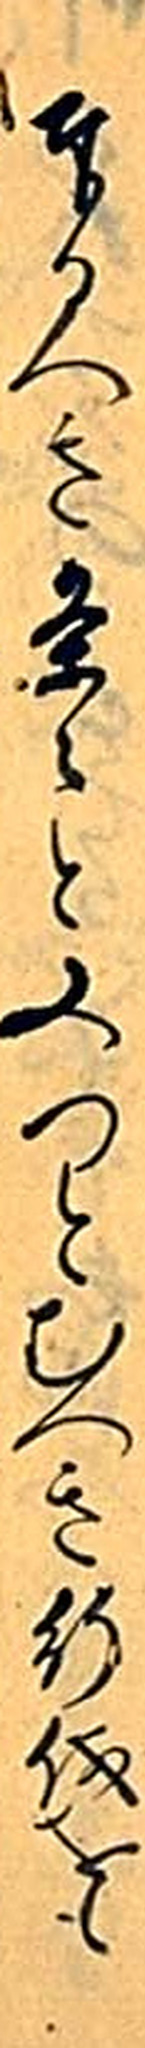奉るへき条々と又つとむへき行儀をも
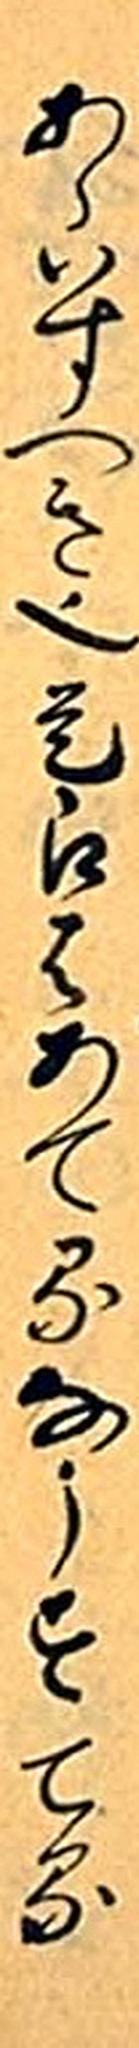あらはすべき也是即はあてるなうすてる
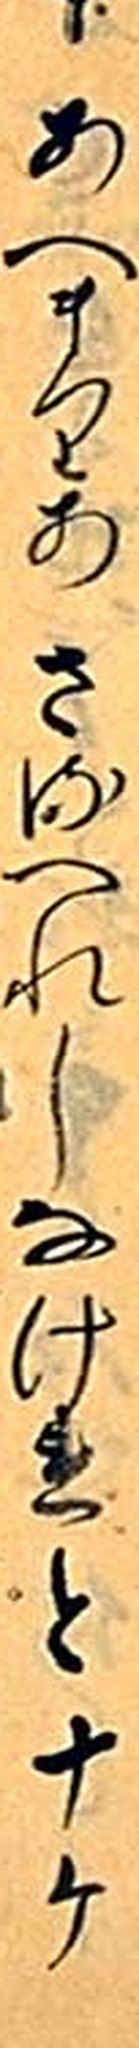あへまりあさるへれしなけれと十ケ
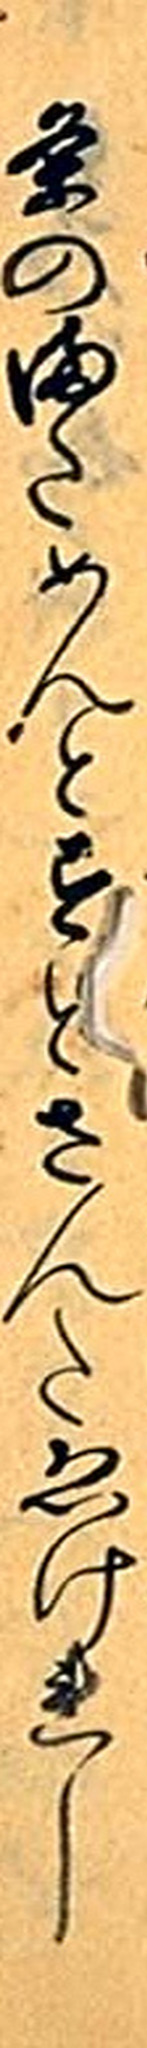条のまためんとすとさんたえけれし
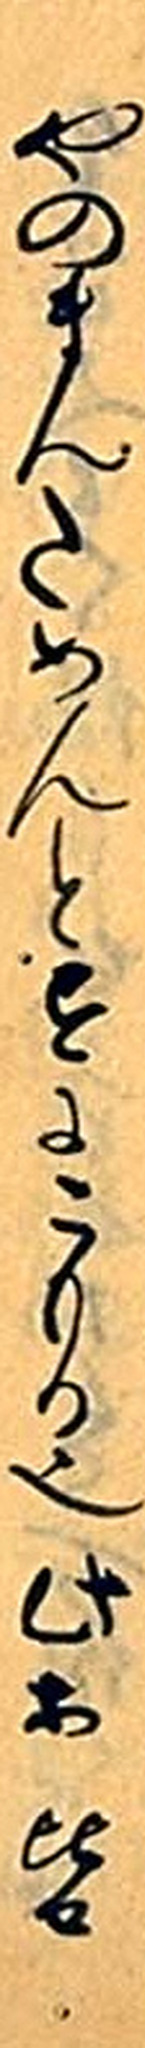やのまんためんとすにこもる也此等皆
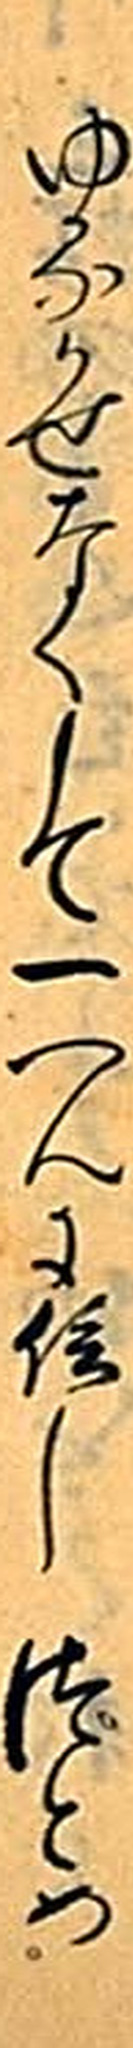ゆるかせなくして一へんに信しつとめ
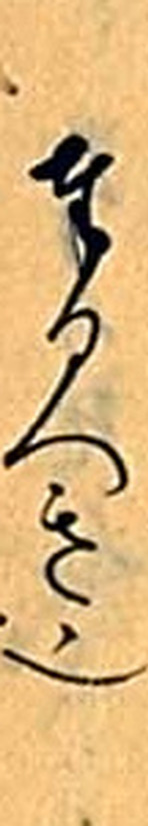奉るへき也
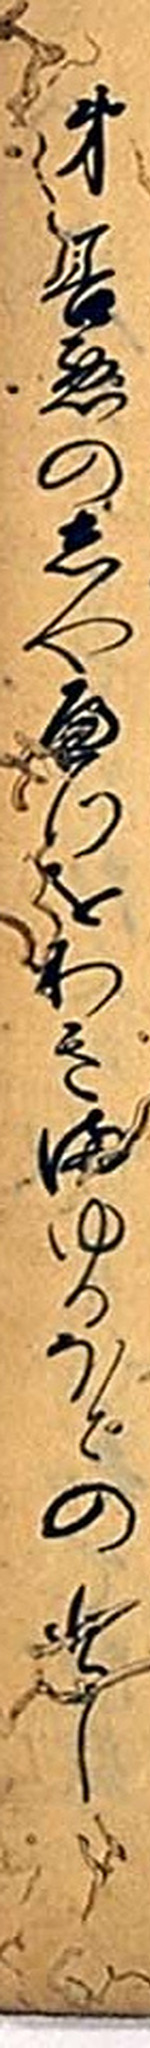弟善悪のしやへつをわきまゆるほとのとし

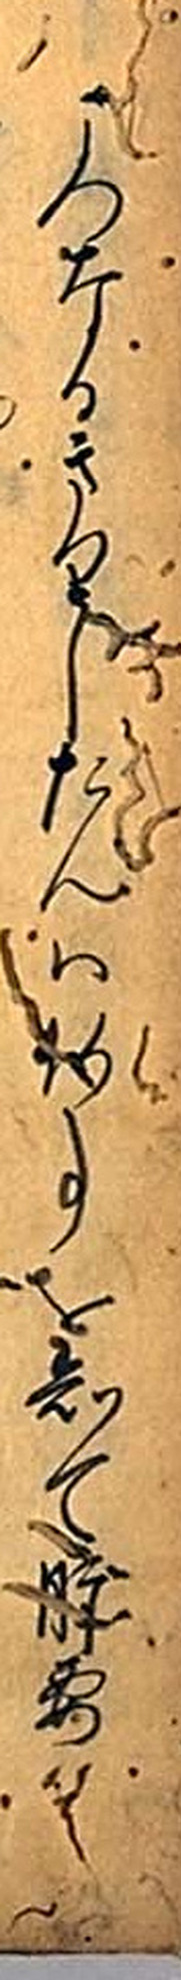ころなるきりしたんは何事を知て肝要
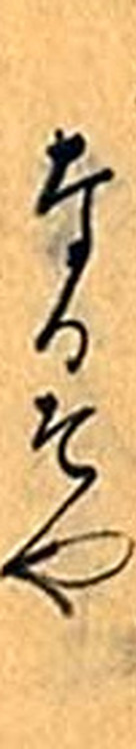なるそや
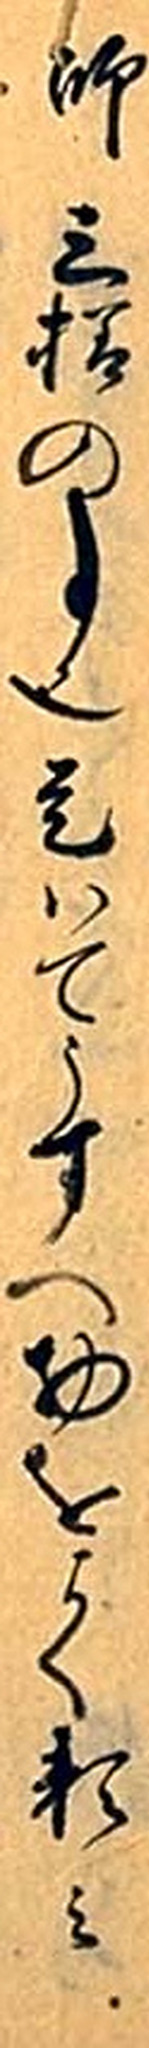師三様の事也是はてうすへ物をよく頼み
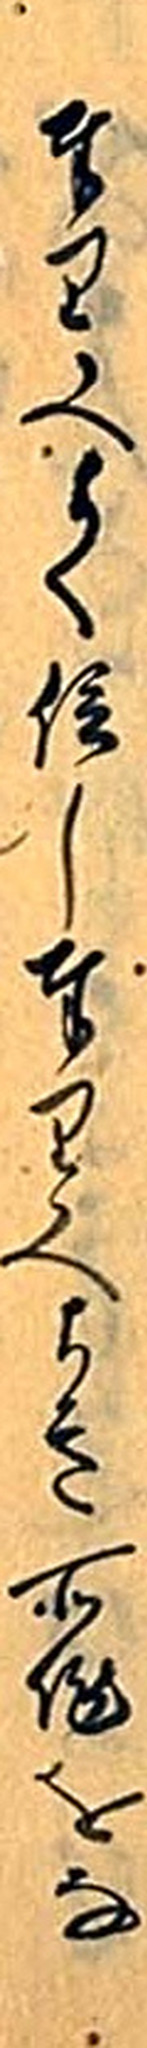奉り又よく信し奉り又よき所作をな
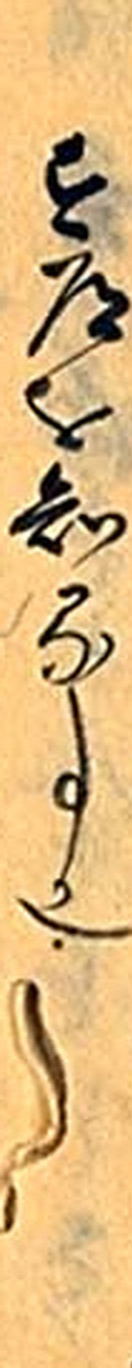す道を知る事也
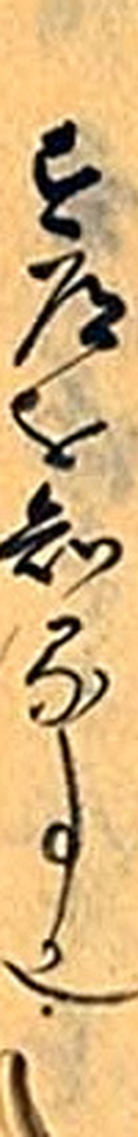す道を知る事也
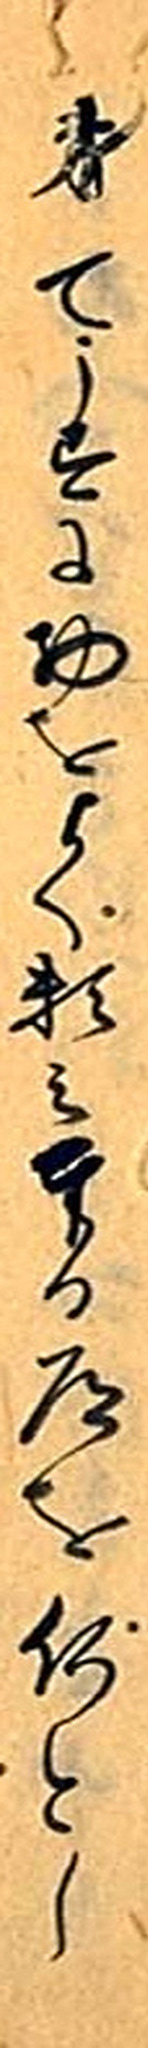弟てうすに物をよく頼み奉る道を何とし
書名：ドチリナ・キリシタン
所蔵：東京大学総合図書館 / General Library in the University of Tokyo
